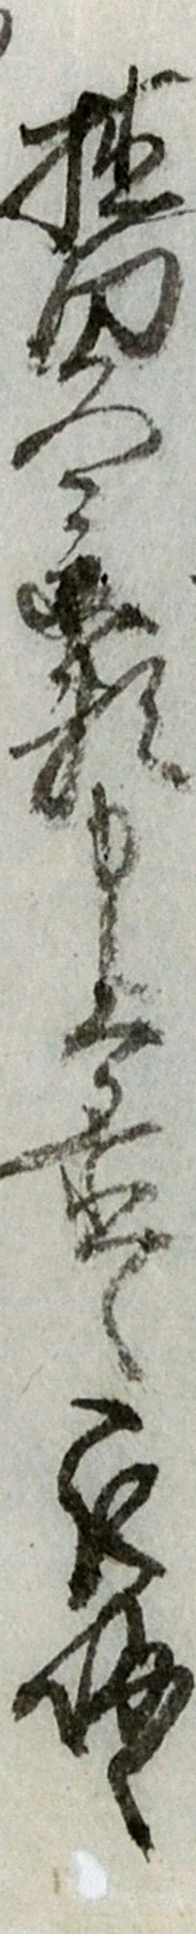植田久兵衛頼申上置候罷帰候
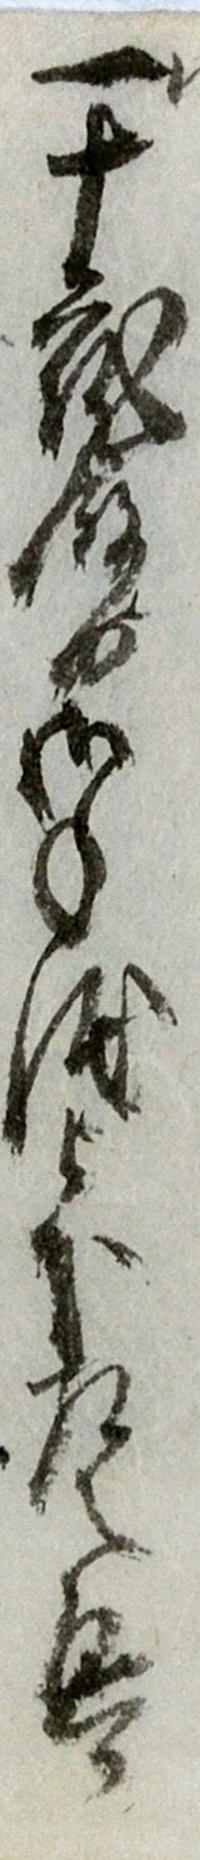一十蔵殿ゟ御手紙被下左之通り
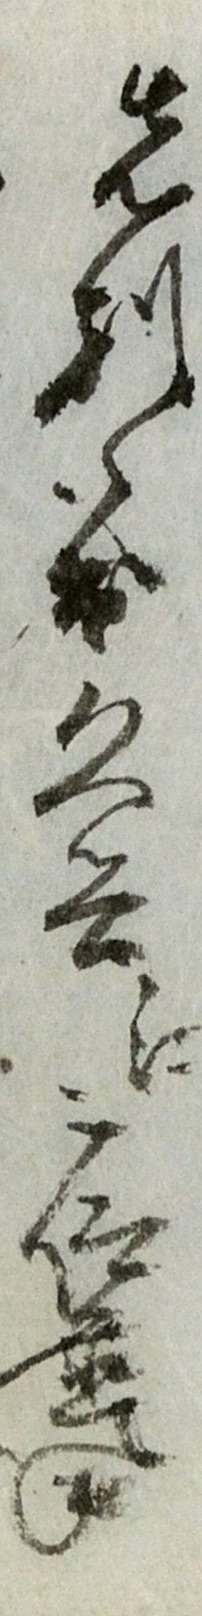先刻御出久兵衛え被仰置候趣
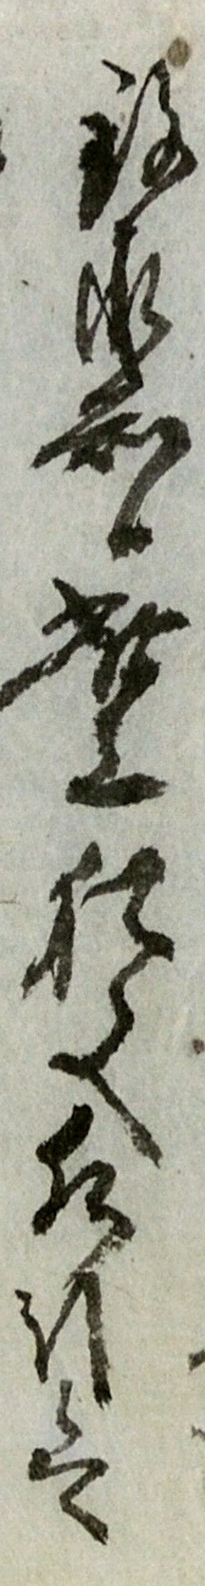致承知候此上猶又水引上候ハヽ
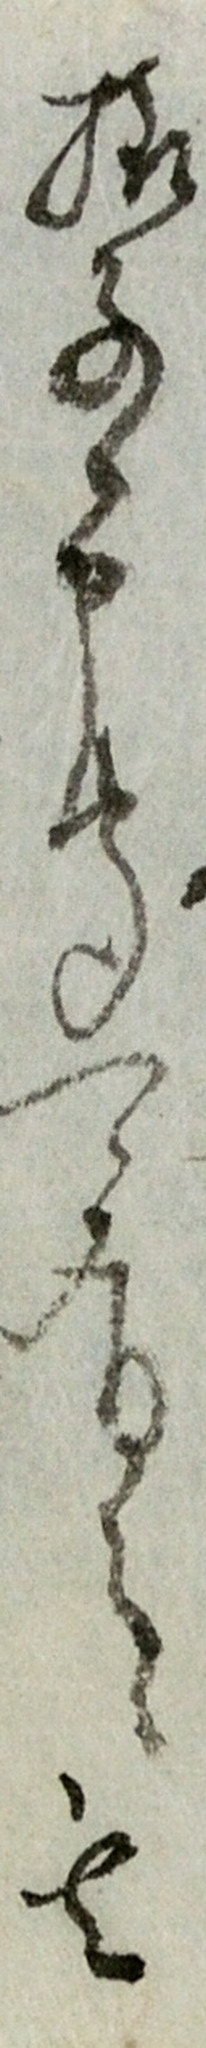様子被申聞可有之候其
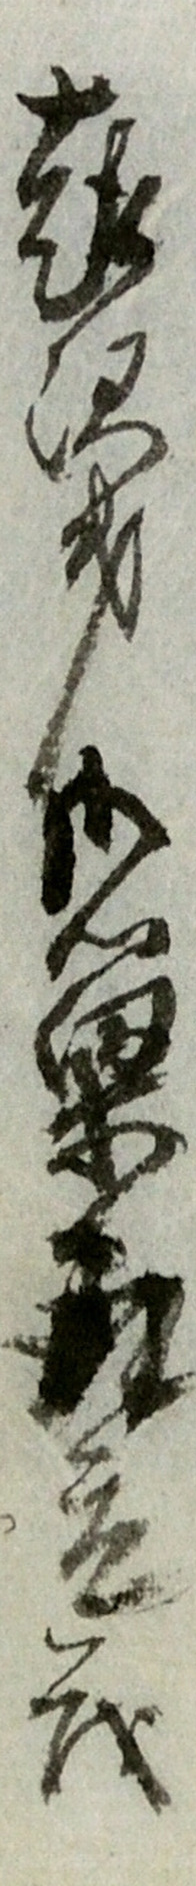趣次第御簗取立も
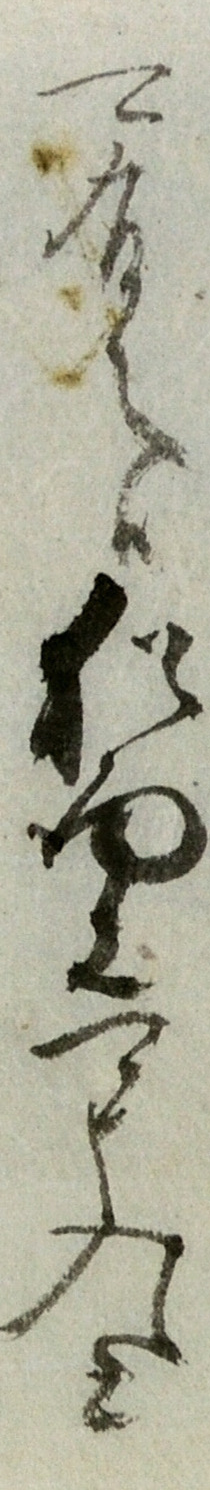可有之候猶向々可申入候以上
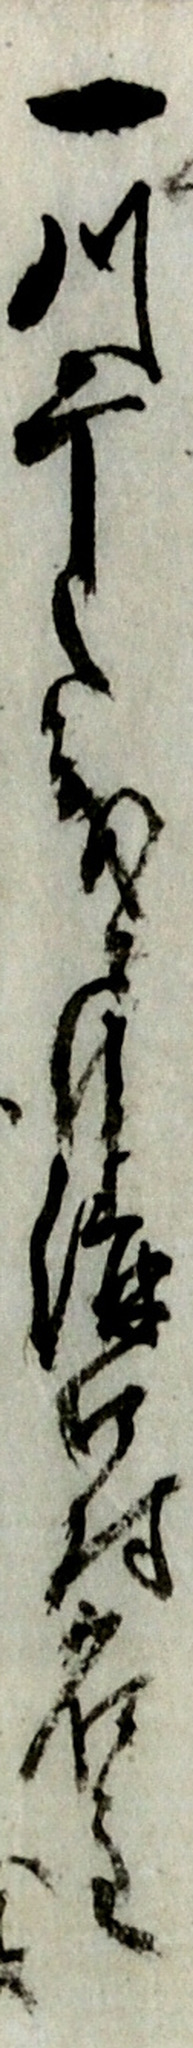一川干之義ニ付溝口村名主
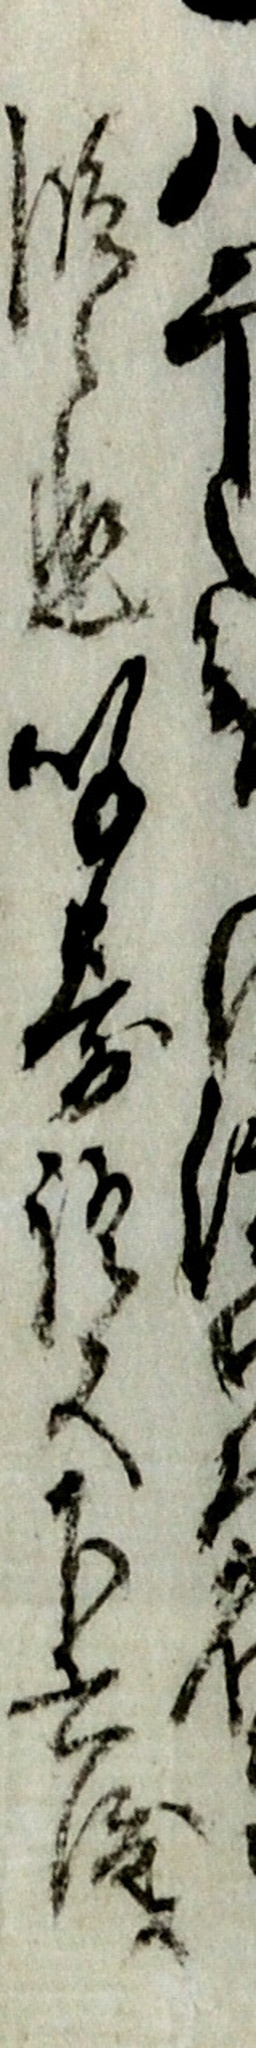段之丞呼寄証文下書渡ス
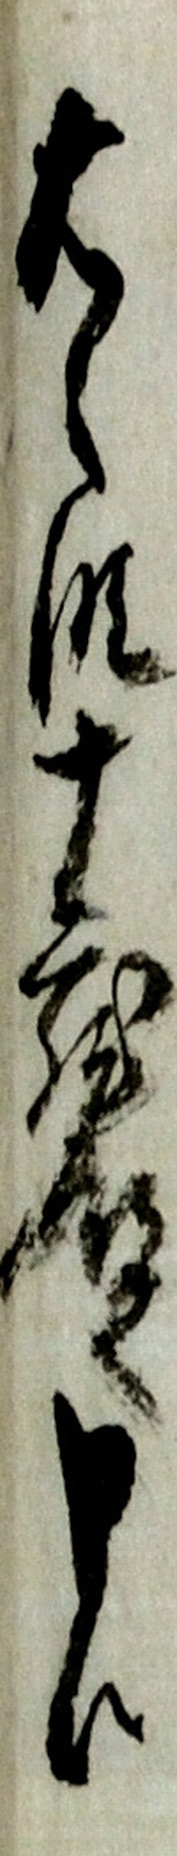右之段十蔵殿へ申候

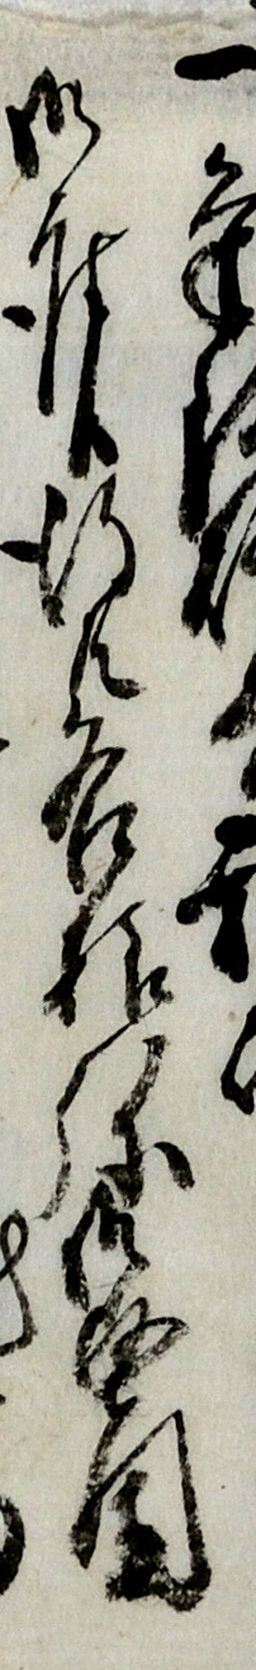御座候得共各様弥御堅固
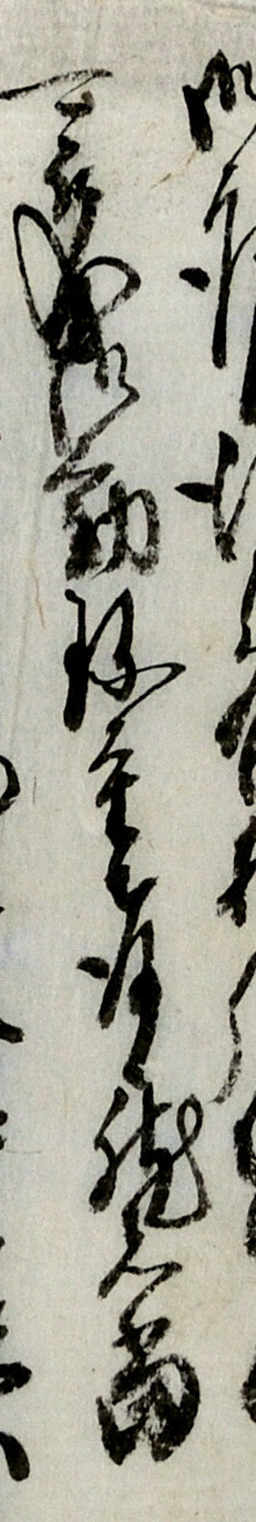可被成御勤珍重奉存候就は当
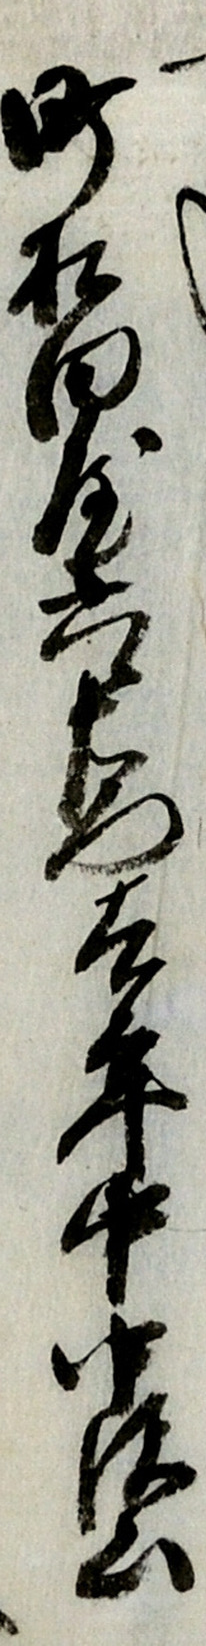町松田屋六郎右衛門去年中中沢山
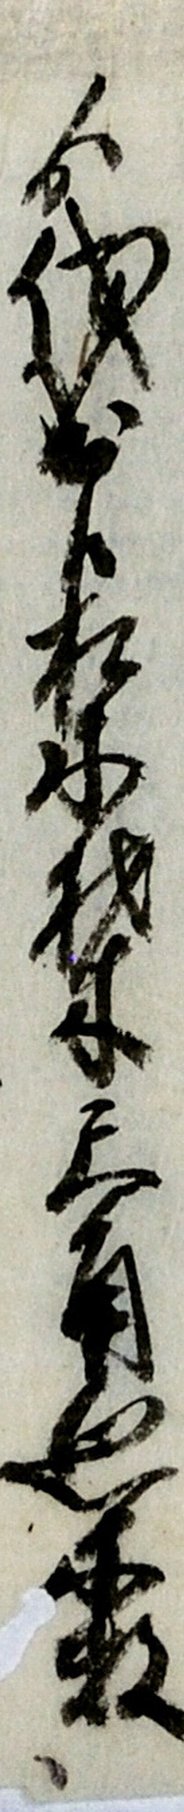ゟ伐出候松木材木尺角廻木数
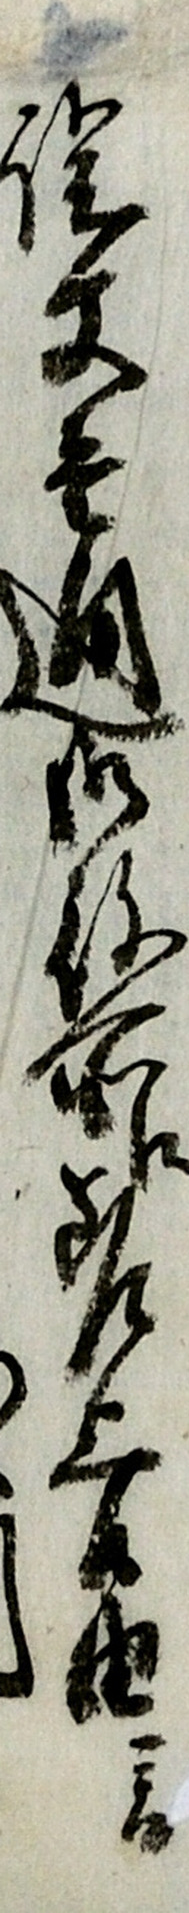証文壱通御役所え差上候由にて
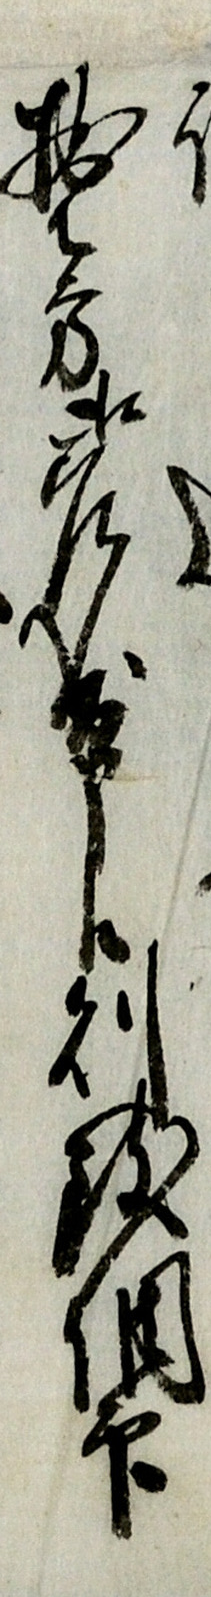拙者方え差出申候則致調印
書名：分一方諸事御用留帳
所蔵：伊那市立高遠町図書館・合同会社AMANE
